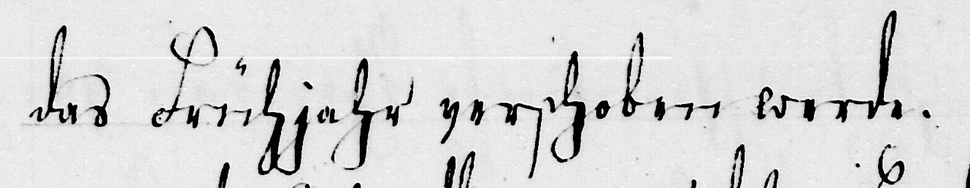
das Frühjahr verschoben werde.
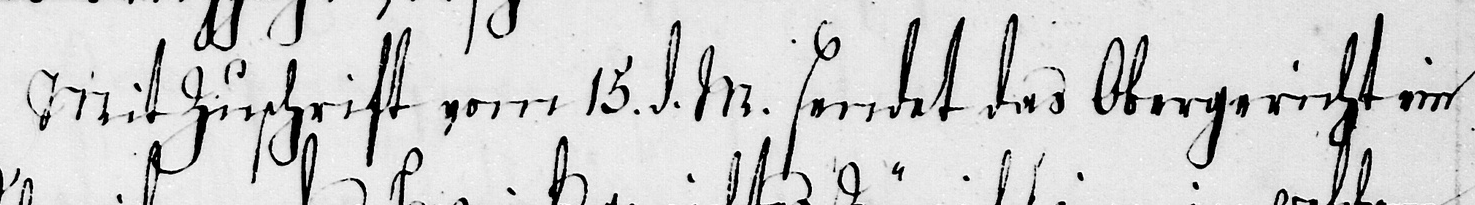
Mit Zuschrift vom 15. d. M. sendet das Obergericht ein
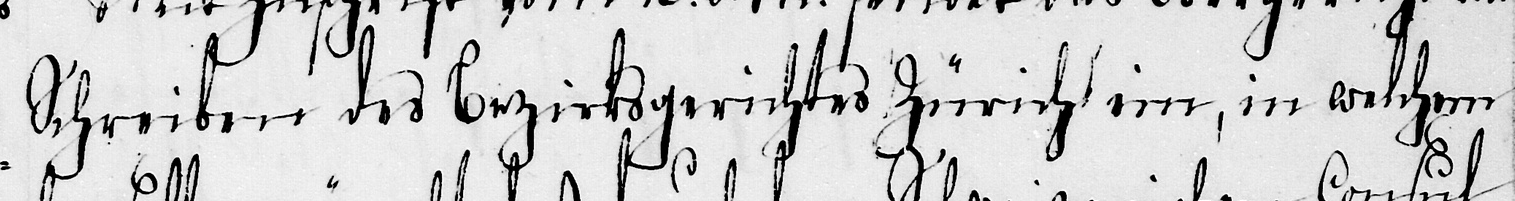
Schreiben des Bezirksgerichtes Zürich ein, in welchem
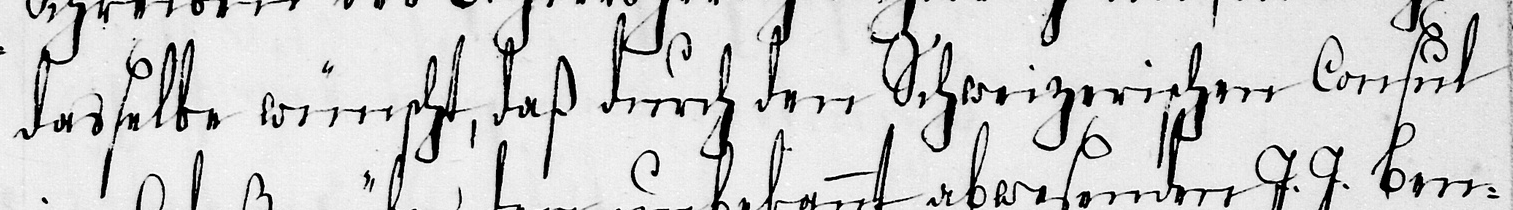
dasselbe wünscht, daß durch den Schweizerischen Consul
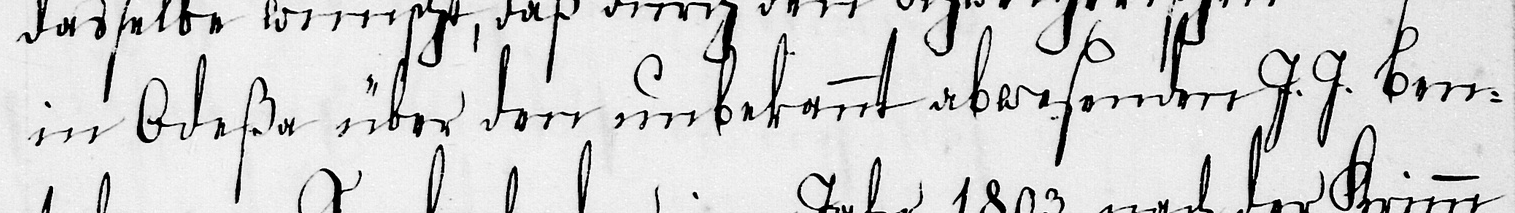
in Odeßa über den unbekannt abwesenden J. J. Ben¬
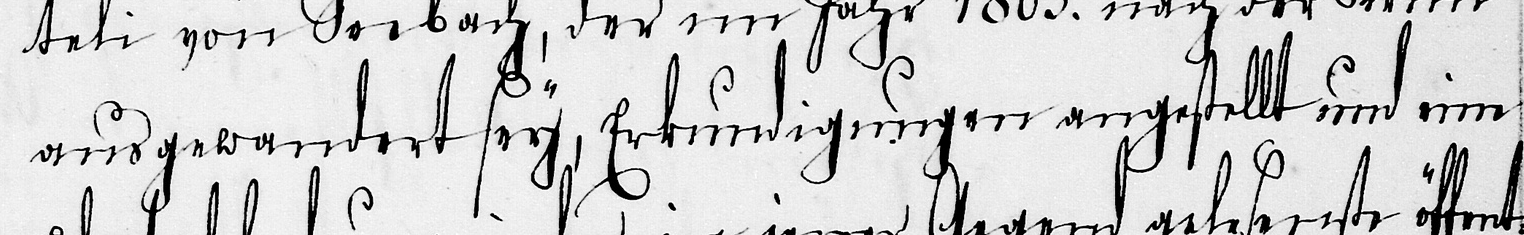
ausgewandert sey, Erkundigungen angestellt und eine
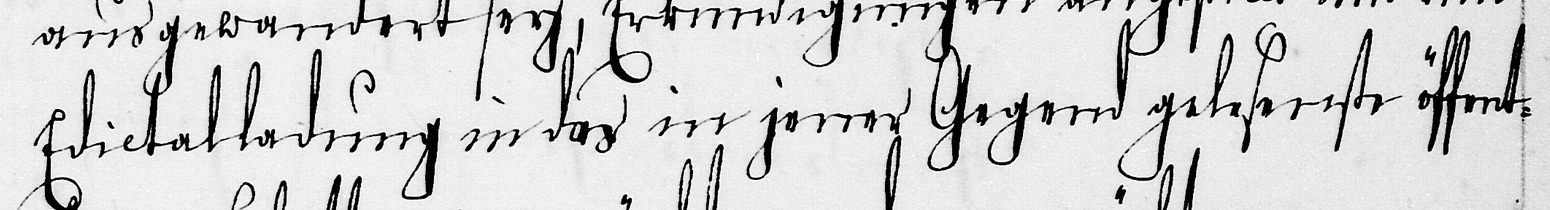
Edictalladung in das in jener Gegend gelesenste öffen¬
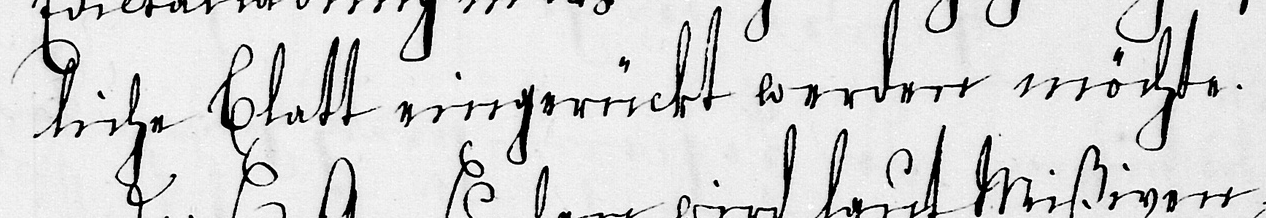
tliche Blatt eingerückt werden möchte.
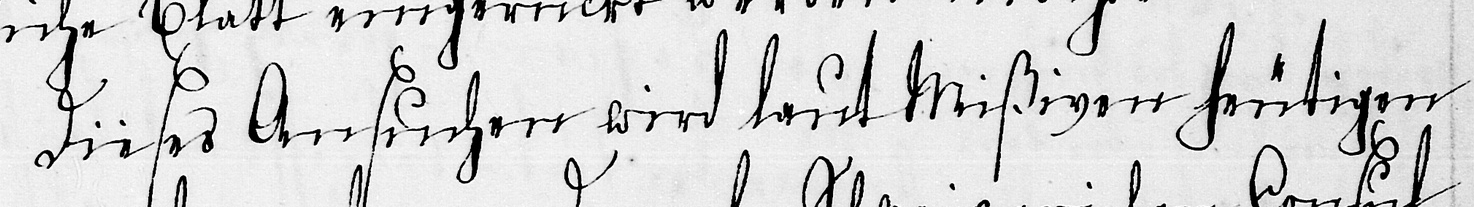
Dieses Ansuchen wird laut Mißiven heutigen
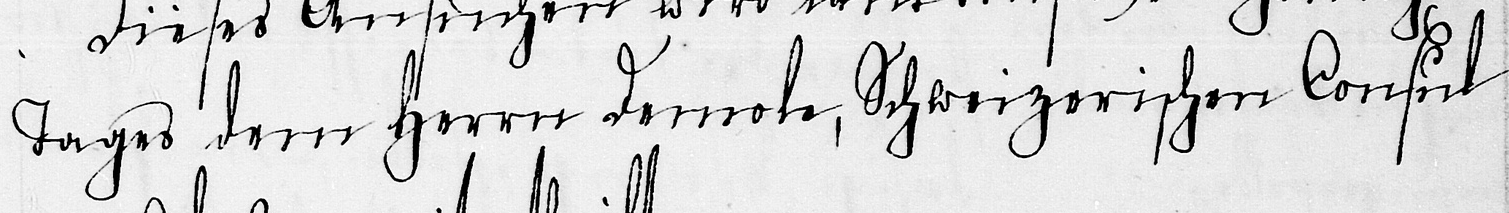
Tages dem Herrn Demole, Schweizerischen Consul
